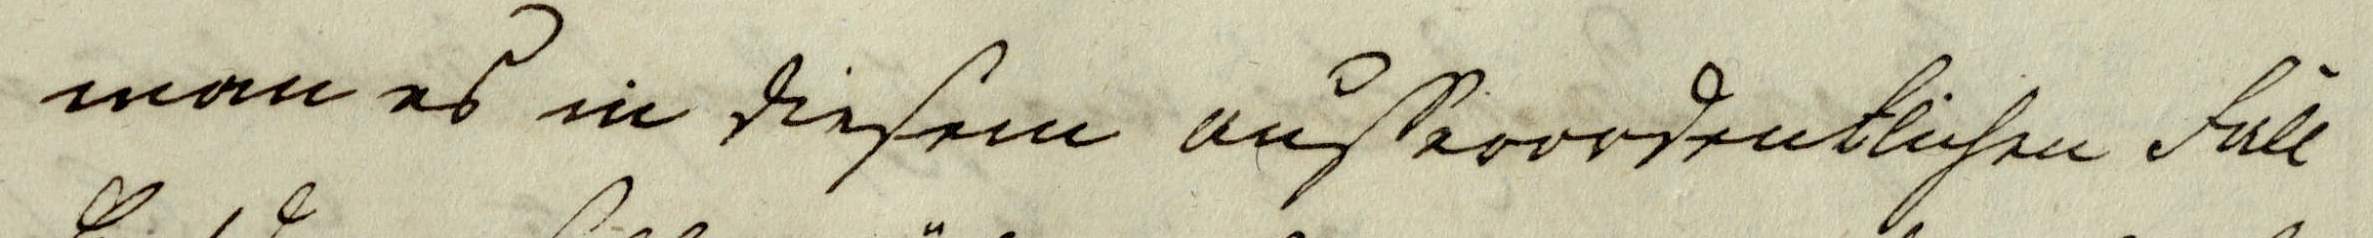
man es in diesem ausserordentlichen Fall
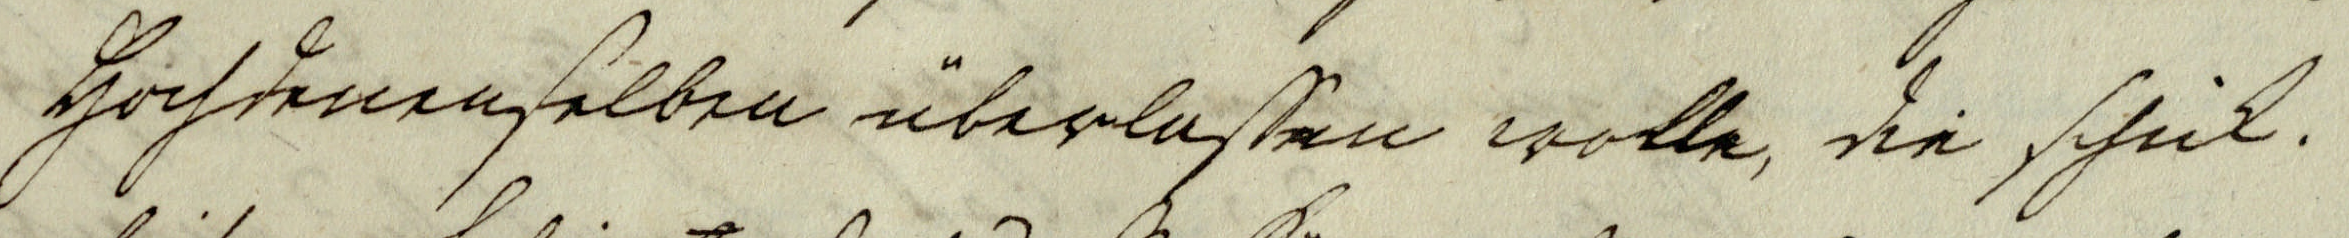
Hochdenenselben überlassen wolle, die schick¬
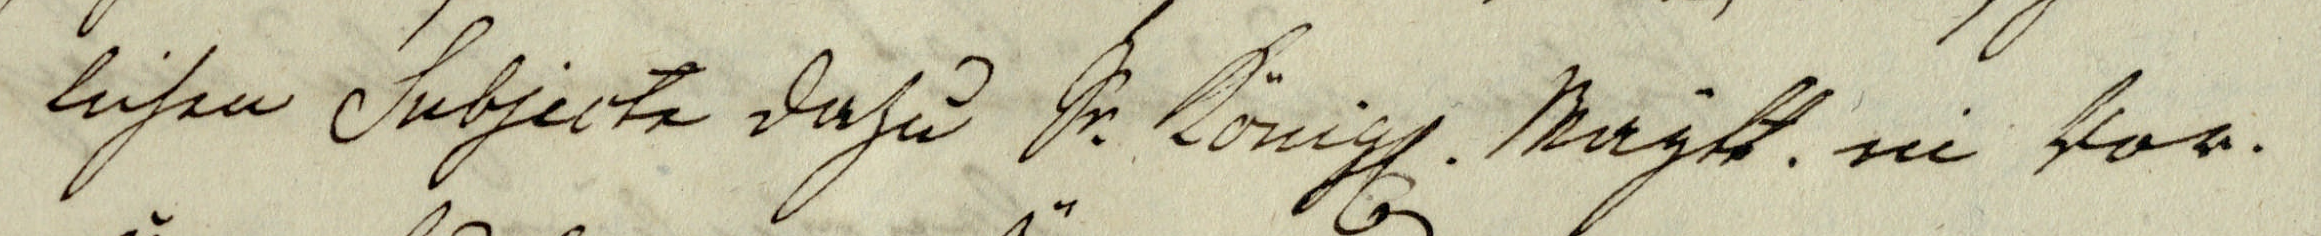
lichen Subjecte dazu Sr. Königl. Maÿst. in Vor¬
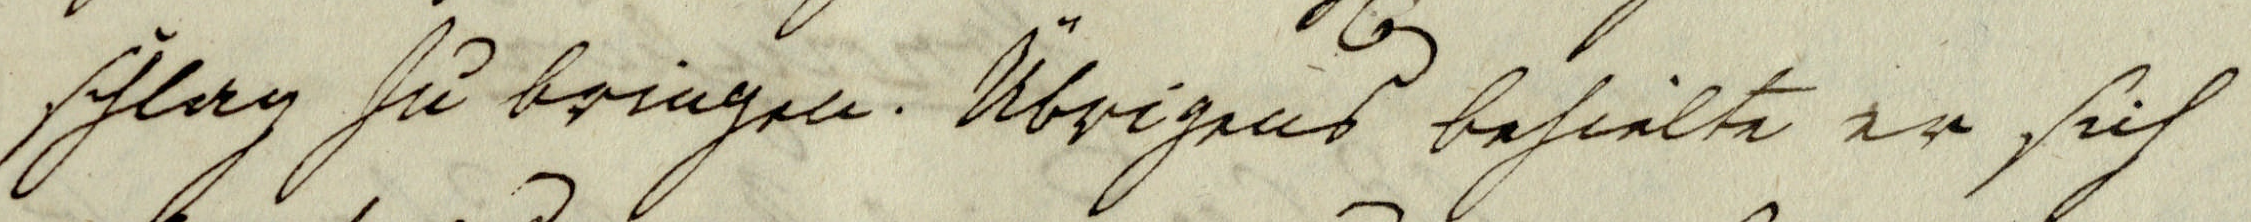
schlag zu bringen. Übrigens behielte er sich
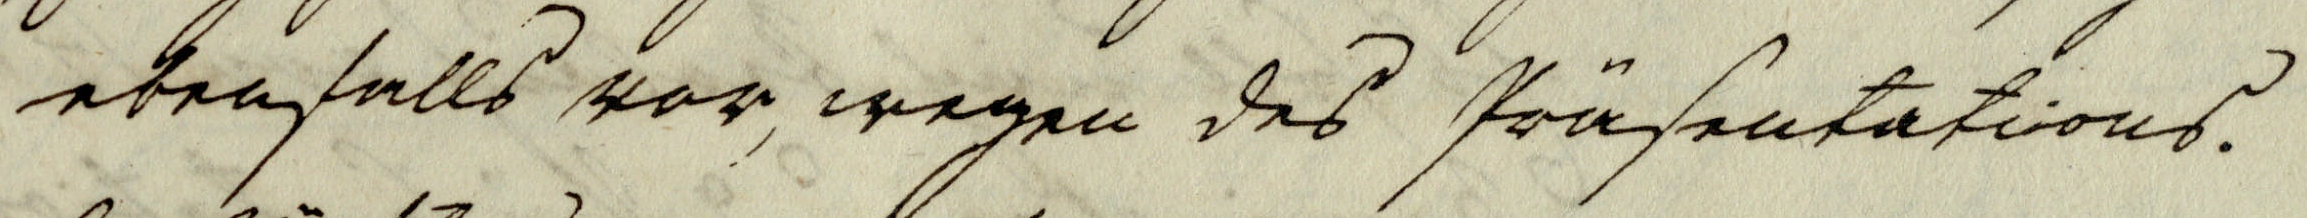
ebenfalls vor, wegen des Präsentations
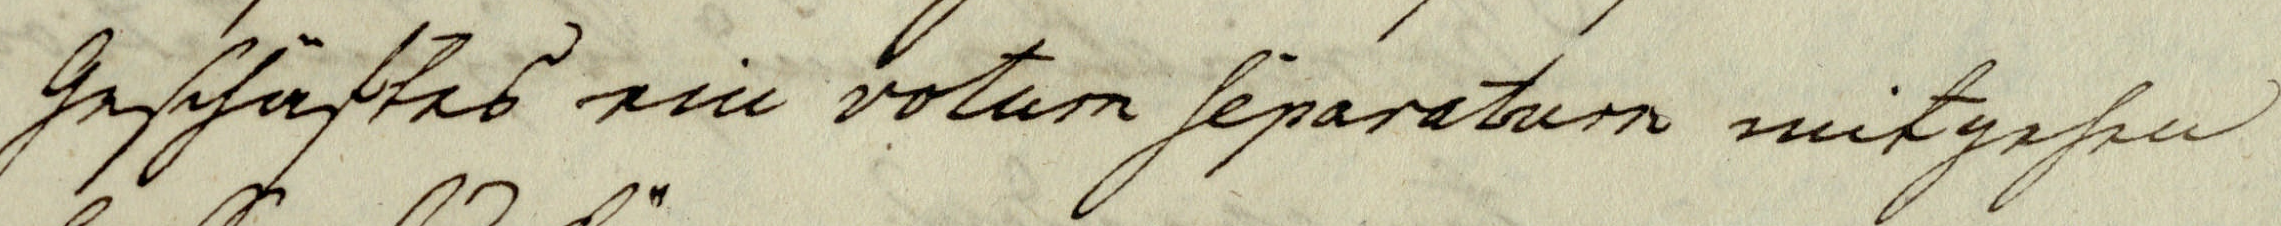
Geschäftes ein Votum separatum mitgehen
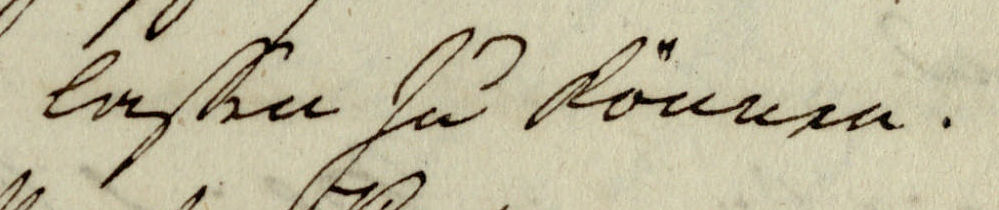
lassen zu können.
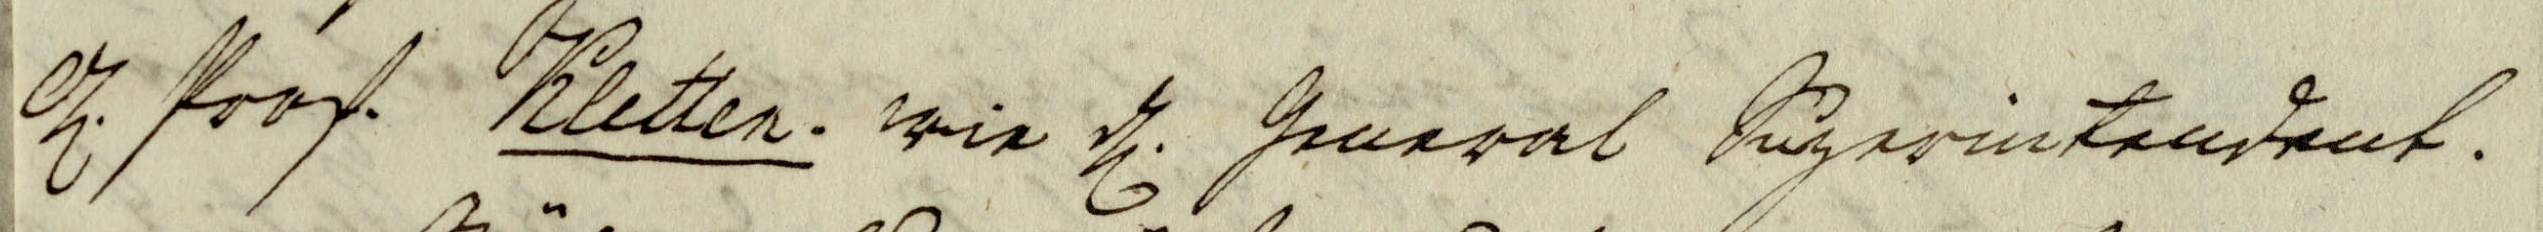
dh. Prof. Kletten. wie dh. General Superintendent.
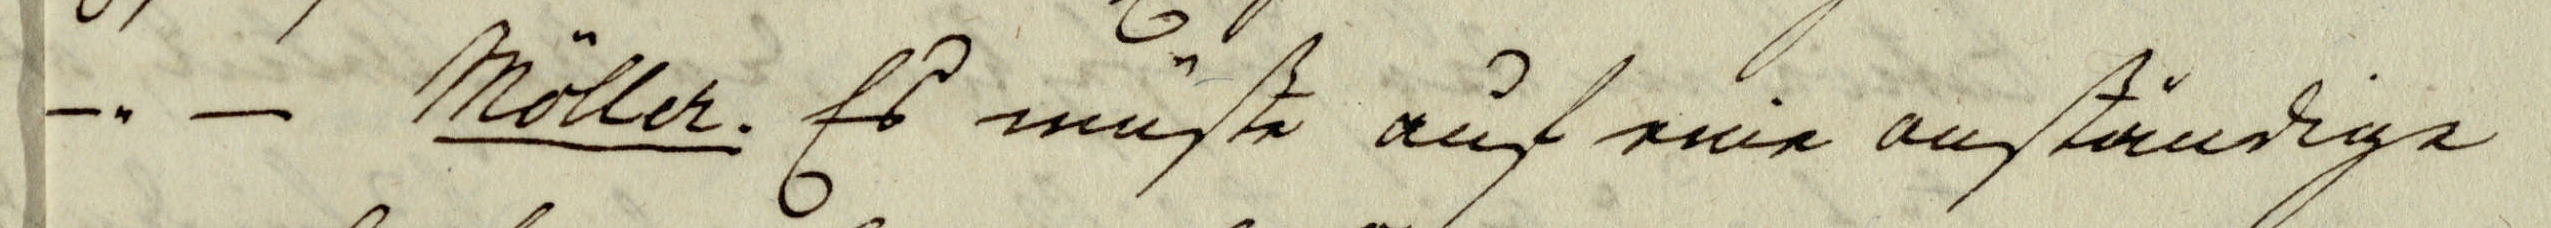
— " — . Möller. Es müßte auf eine anständige
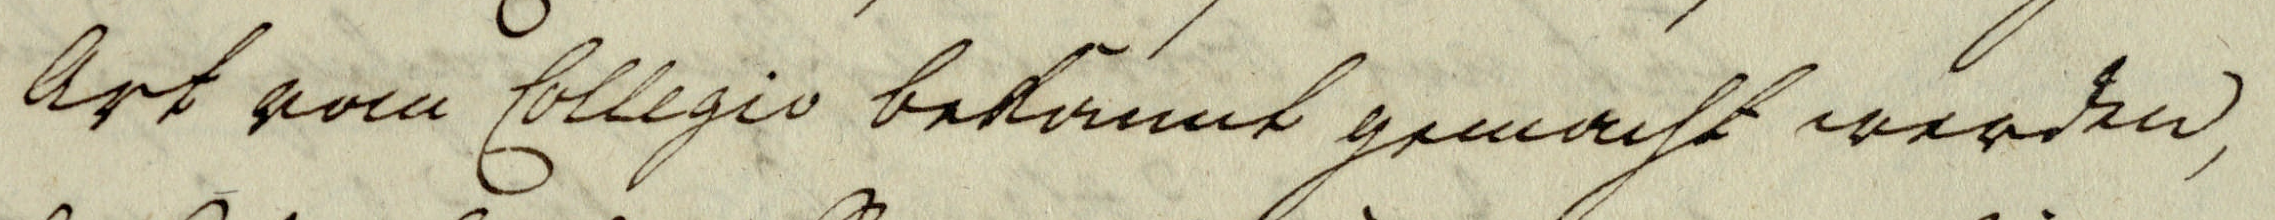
Art vom Collegio bekannt gemacht werden,
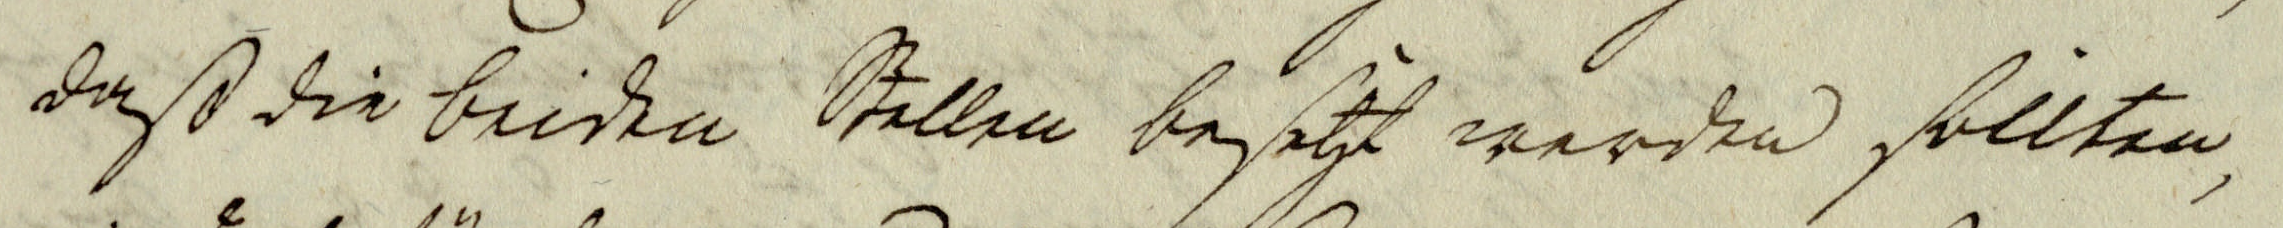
daß die beiden Stellen besetzt werden sollten,
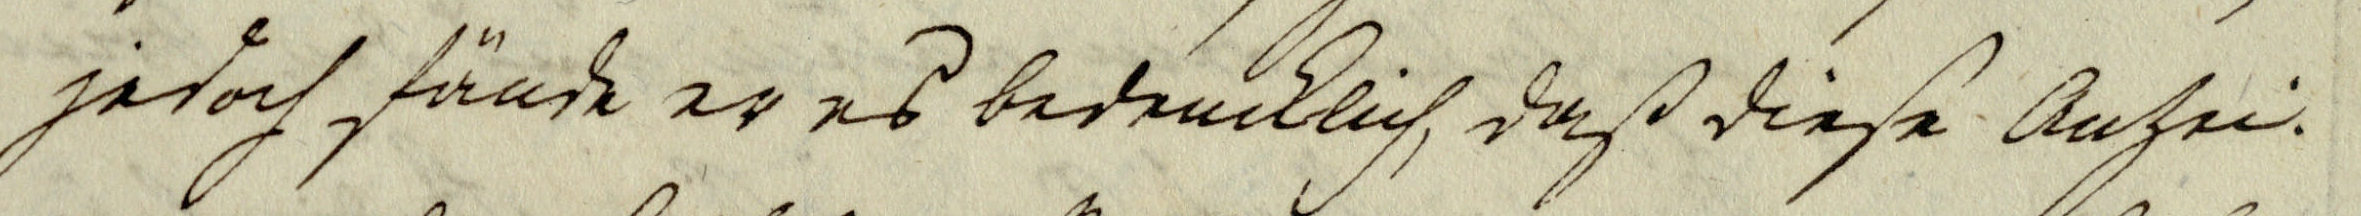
jedoch fände er es bedenklich, daß diese Anzei¬
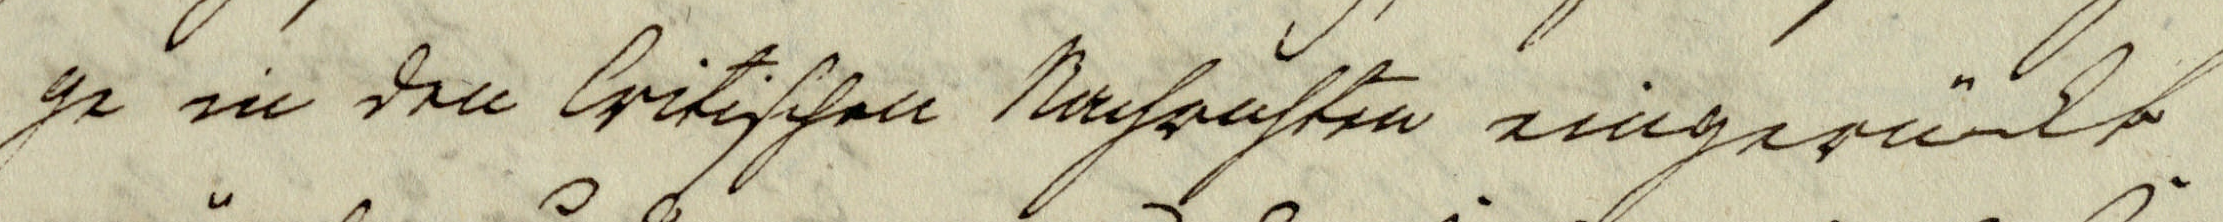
ge in den Critischen Nachrichten eingerückt
